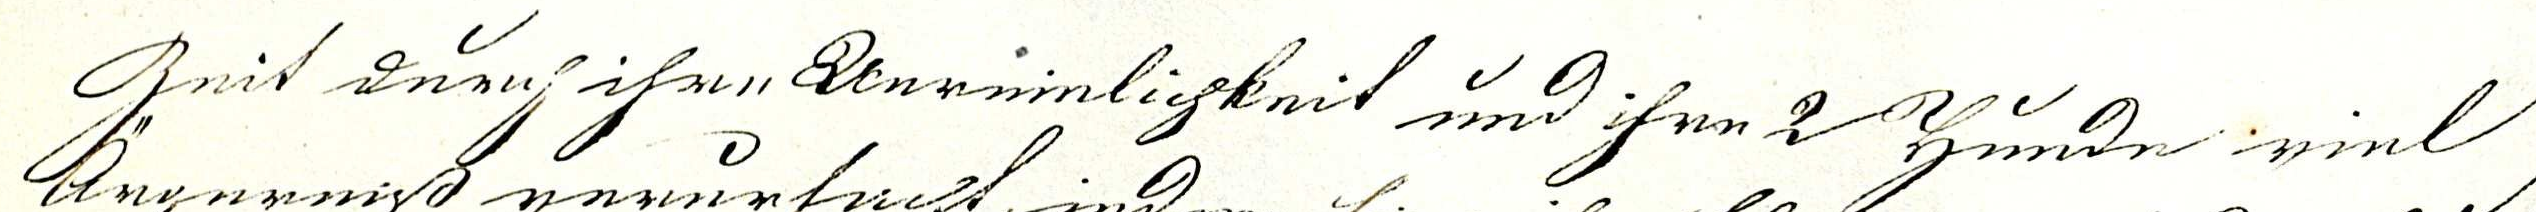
Zeit durch ihre Vereinlichkeit und ihre 2 Hunde viel
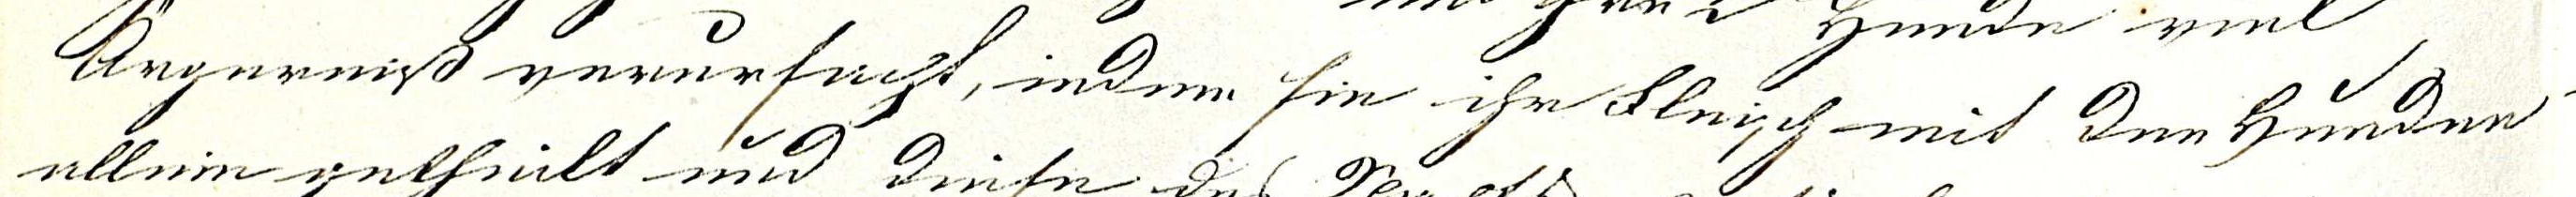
Ärgerniß verursacht, indem sie ihr Fleisch mit den Hunden
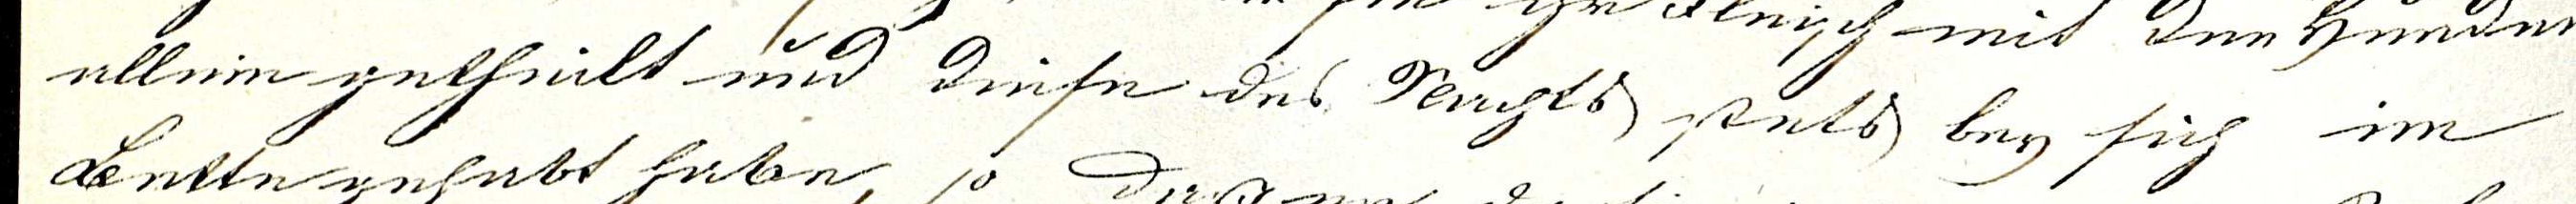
allein getheilt und diese des Nachts stets bey sich im
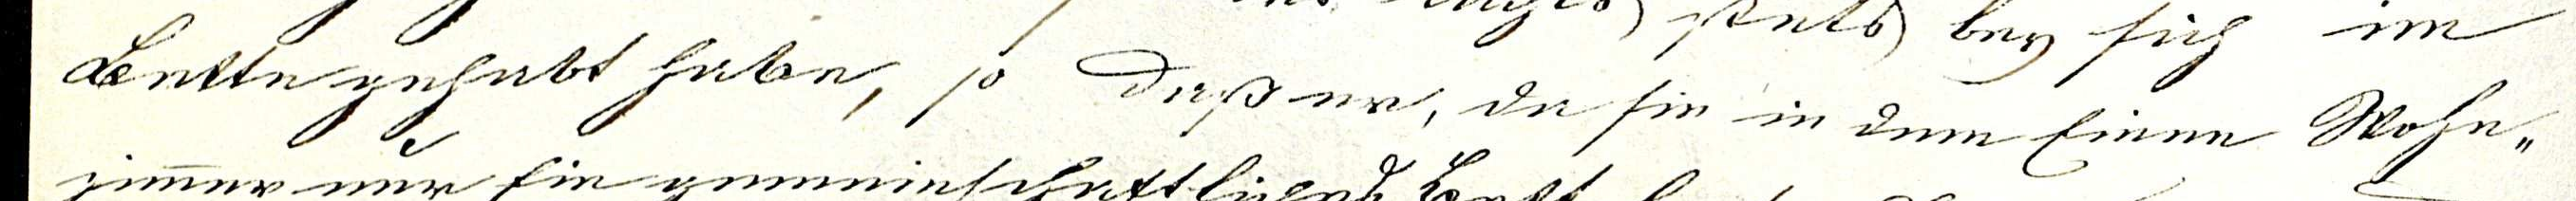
Bette gehabt habe, so daßer, da sie in dem Einen Wohn¬
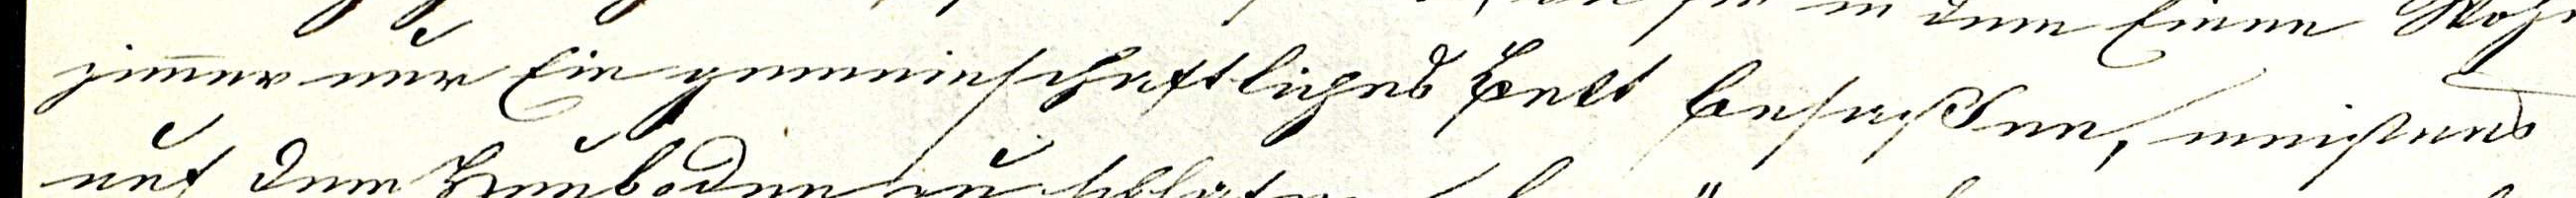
zimmer nur Ein gemeinschaftliches Belt befassen, meistens
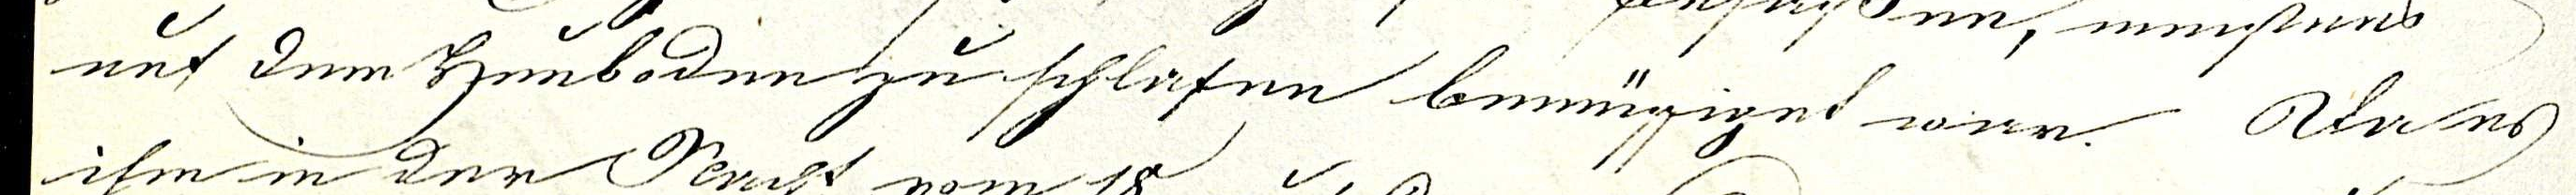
auf dem Heuboden zu schlafen bemüssiget war. Da es
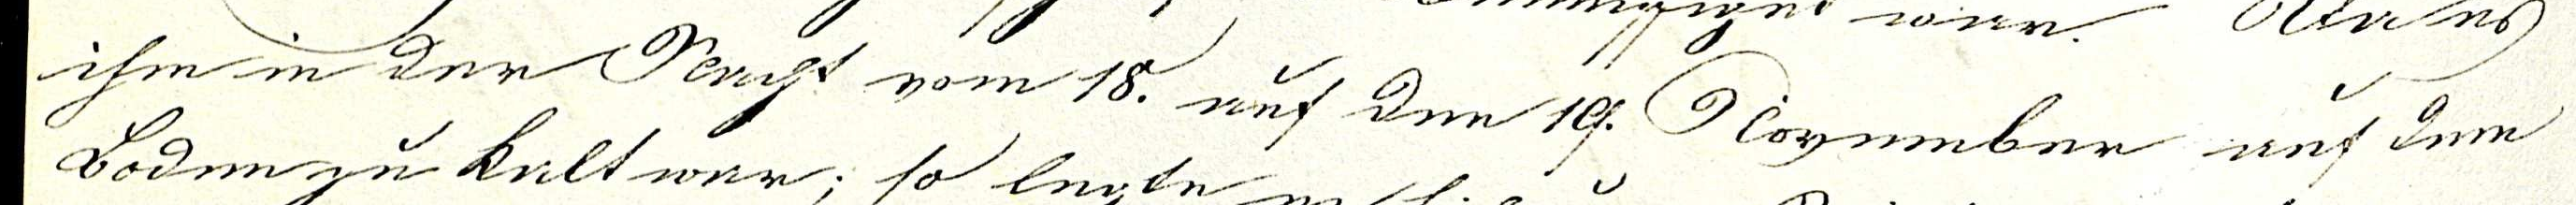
ihm in der Nacht vom 18. auf den 19. November auf dem
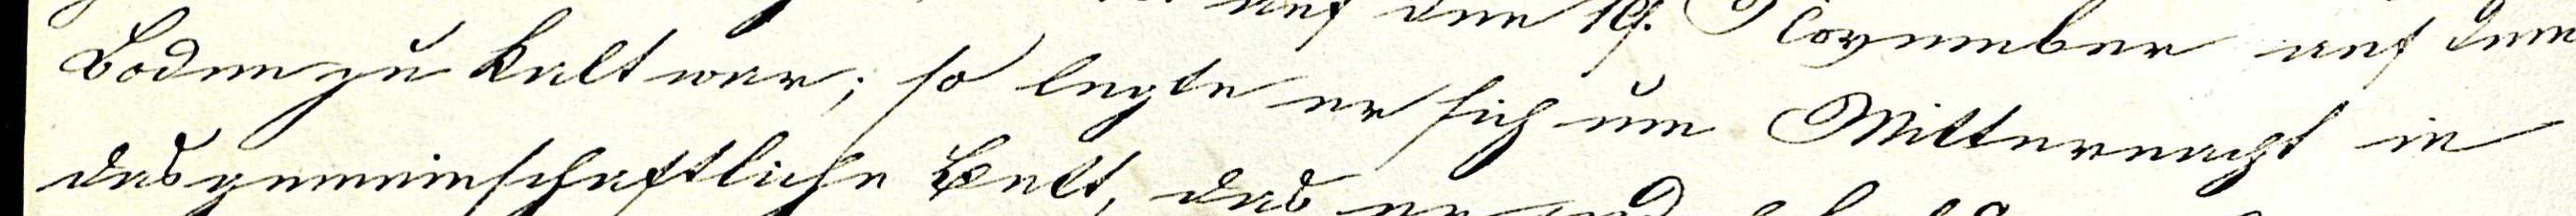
Boden zu kalt war; so legte er sich um Mitternacht in
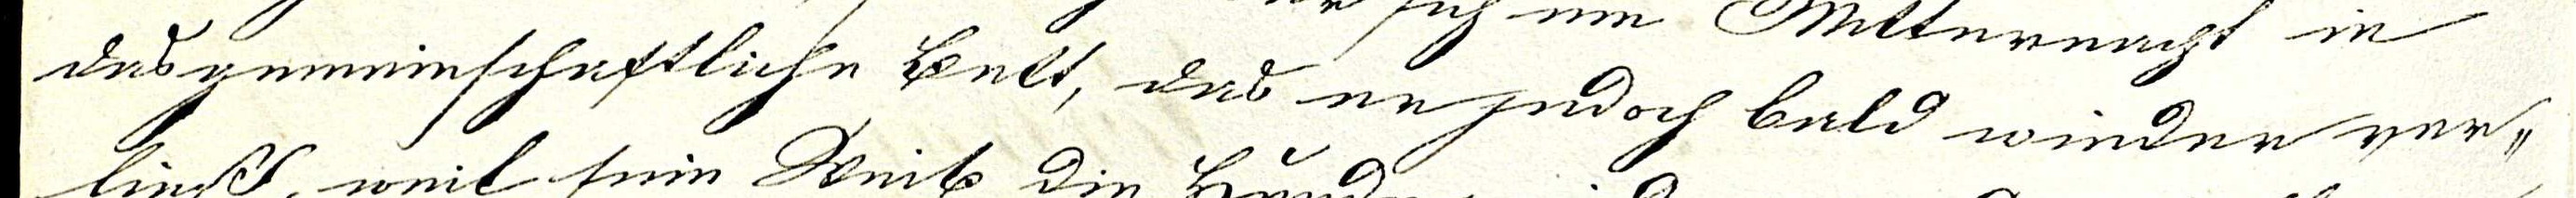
das gemeinschaftliche Belt, das er jedoch bald wieder ver¬
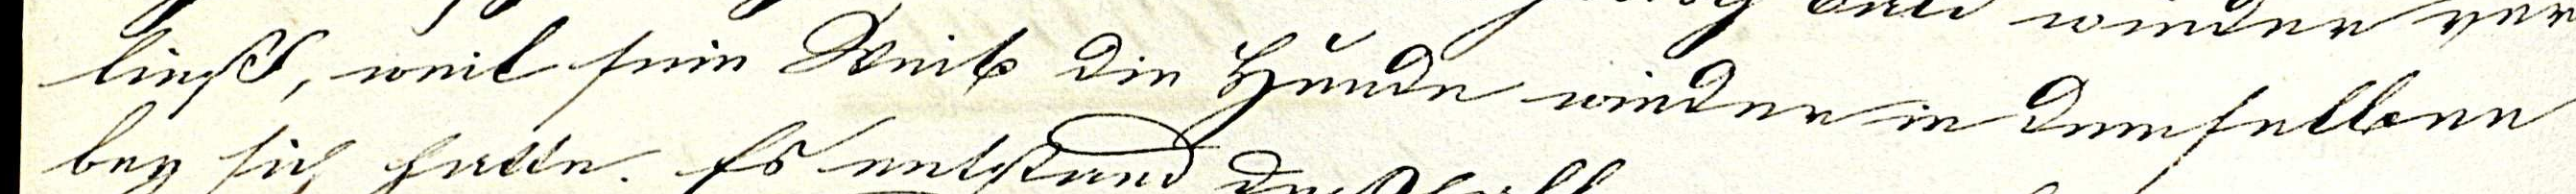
ließ, weil sein Weib die Hunde wieder in demselben
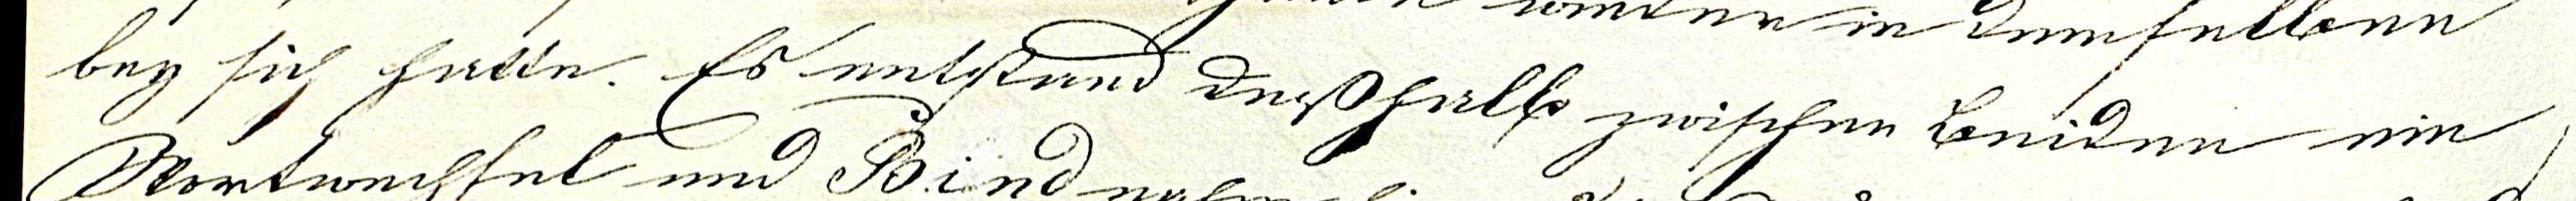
bey sich hatte. Es entstand deßhalb zwischen Beiden ei
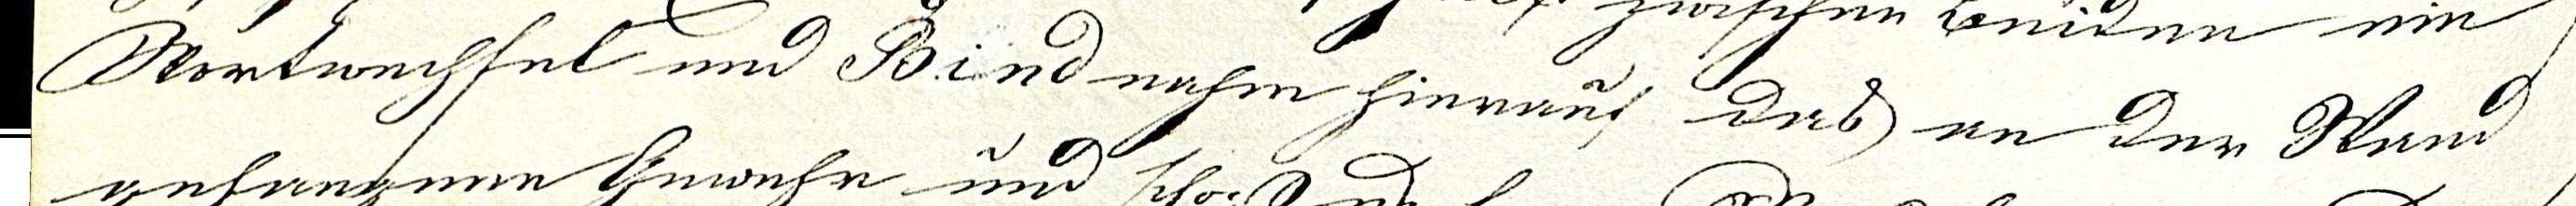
Wortwechsel und Bind nahm hierauf das an der Wand
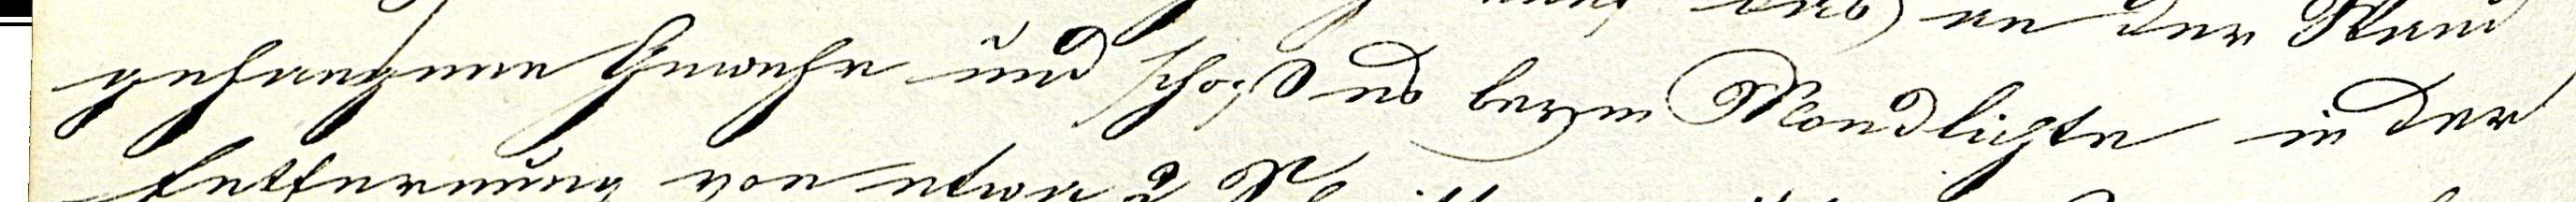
gehangene Gewehr und schoß es beym Mondlichte in der
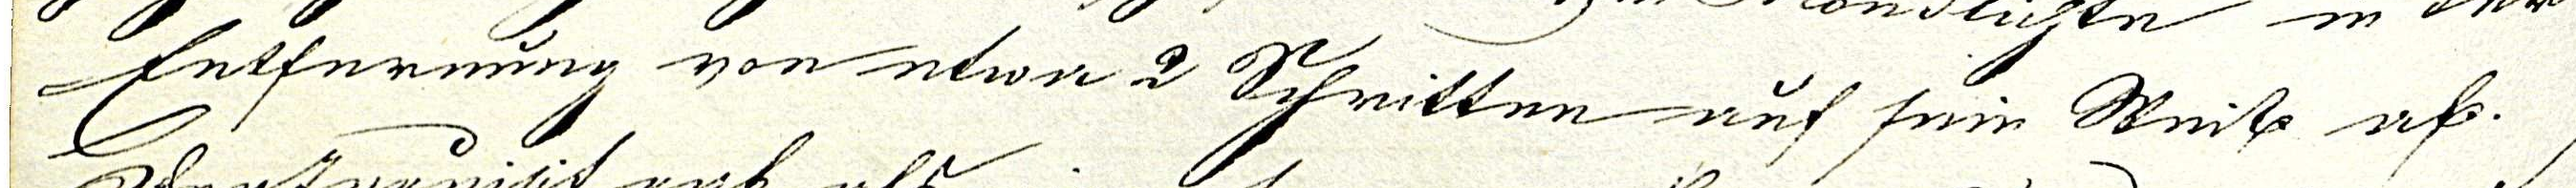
Entfernung von etwa 2 Schritten auf sein Weib b.
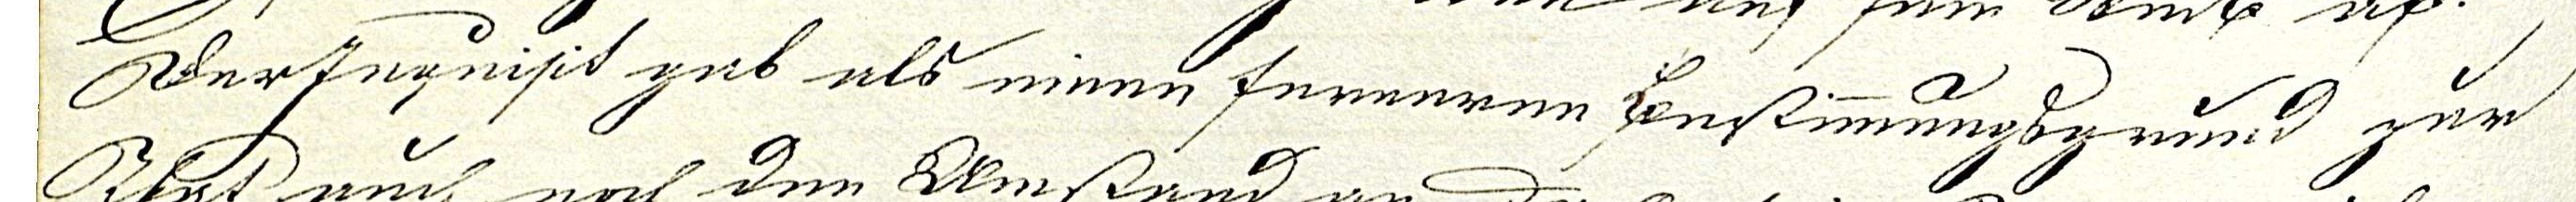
Der Jnquisit gab als einen ferneren Bestimmungsgrund zur
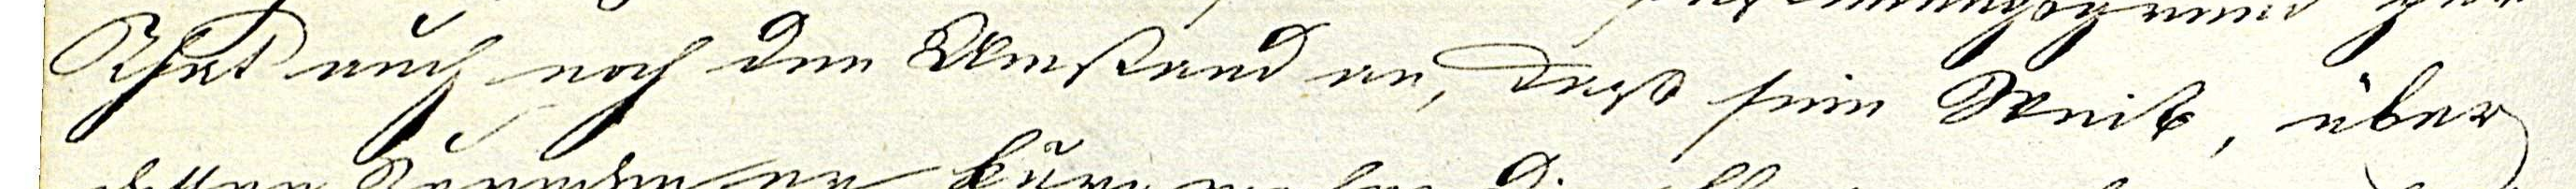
That auch noch den Umstand an, daß seinWeib, über
